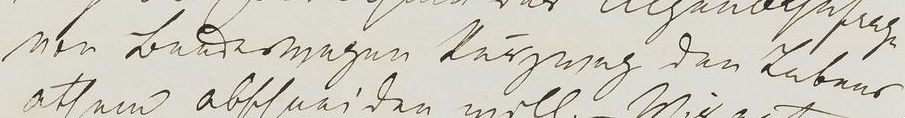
von Bundeswegen kurzweg den Lebens-
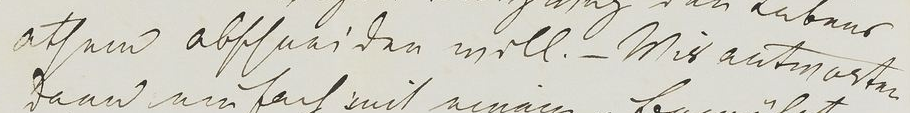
athem abschneiden will. – Wir antworten
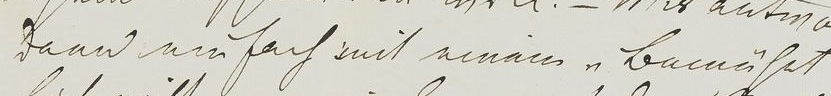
dann einfach mit einem «Bemühet
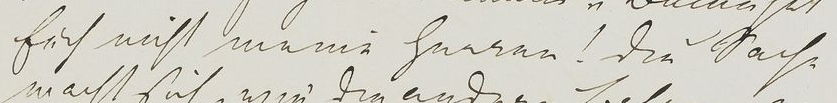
Euch nicht meine Herren! Die Sache
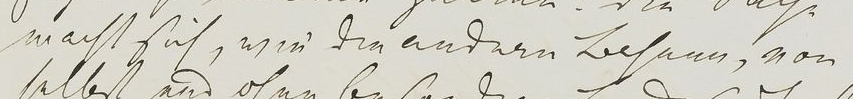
macht sich, wie die andern Bahnen, von
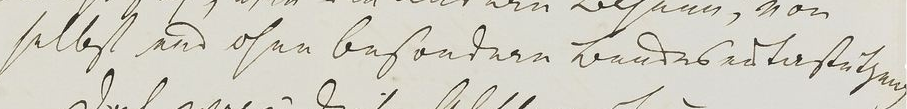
selbst und ohne besondere Bundesunterstützung.»
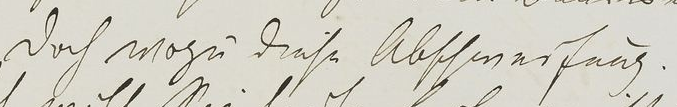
Doch wozu diese Abschweifung.
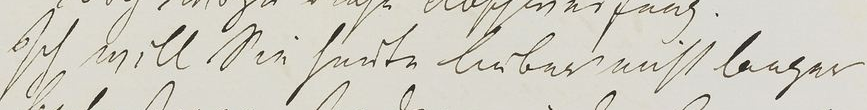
Ich will Sie heute lieber nicht länger
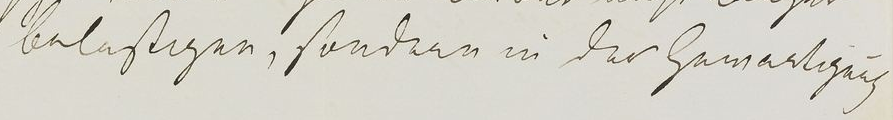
belästigen, sondern in der Gewärtigung
